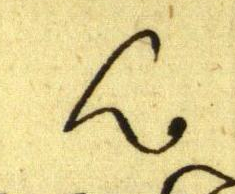t
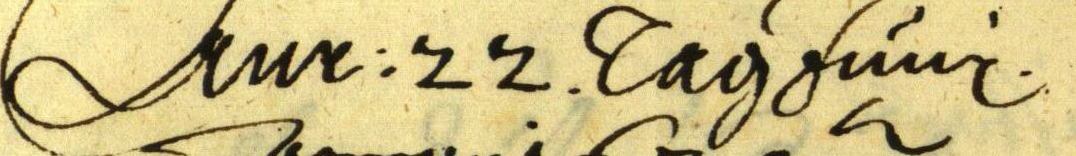Am: 22. Tag Jūnj.
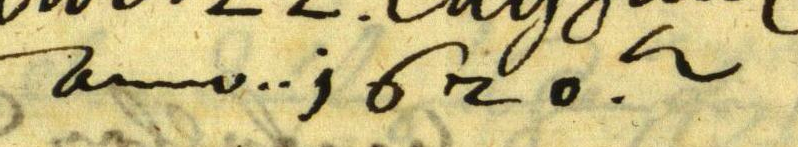Anno: 1620.t
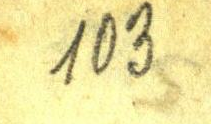103
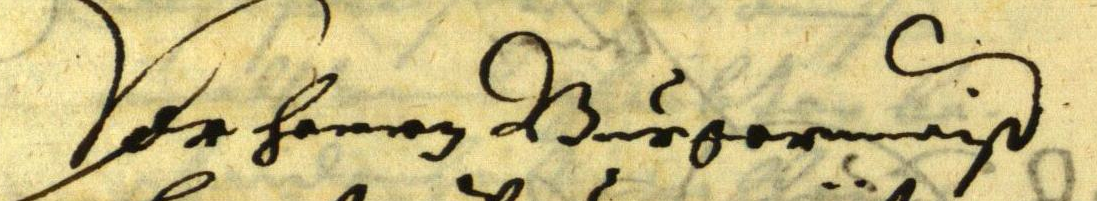Vor herrn Būrgermaist
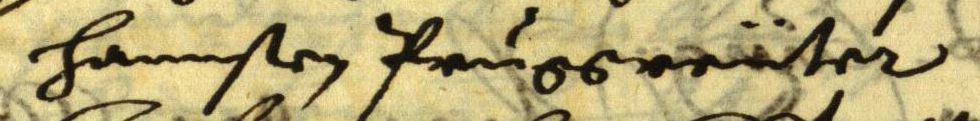hannsen Prūggreüter
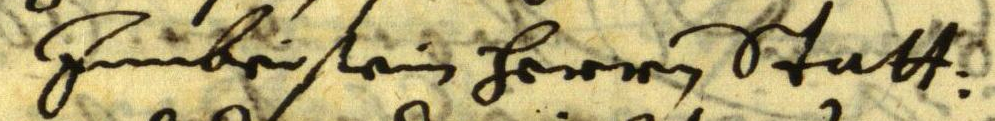Innbeisein herrn Statt¬
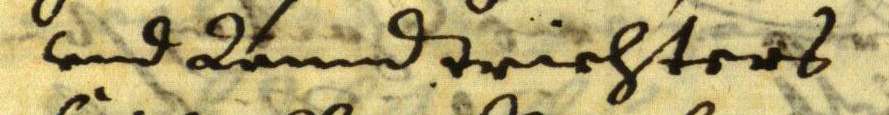vnd Lanndtrichters
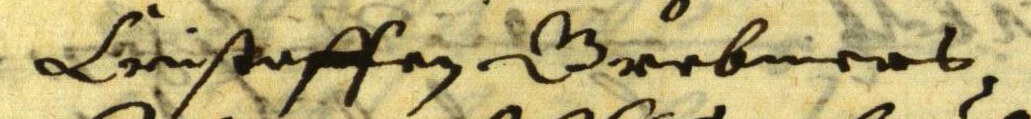Cristoffen Grebmers
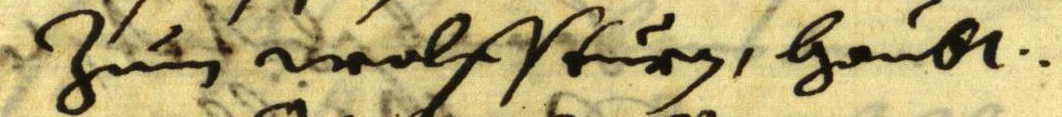Zūm Wolfstūrn, Haūbt¬
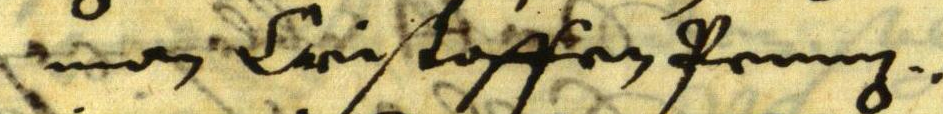man Cristoffen Pennz¬
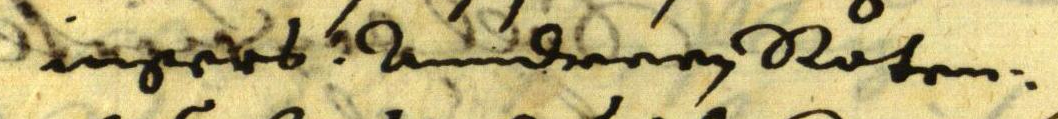ingers. Anndreen Roten¬
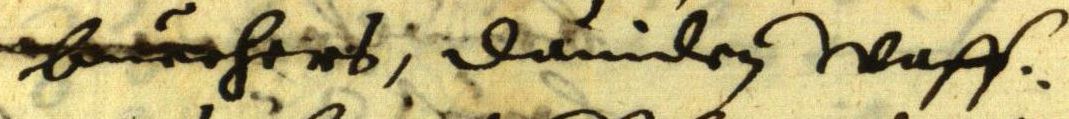būechers, Daūiden Waff¬
